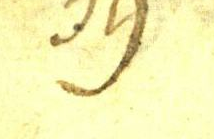19
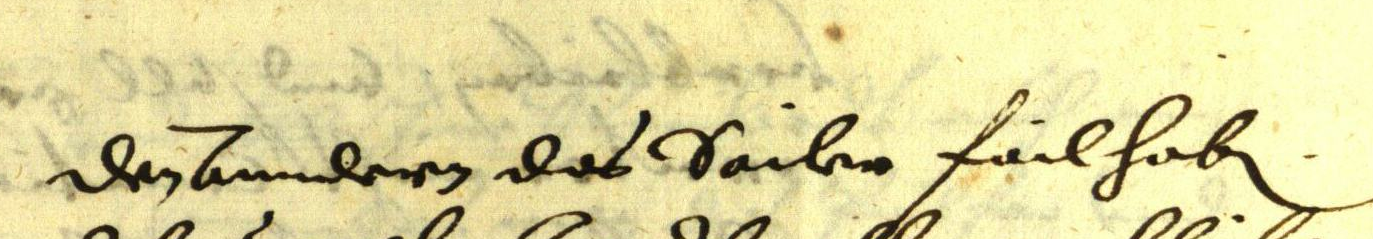den Anndern das Sailer fail hab
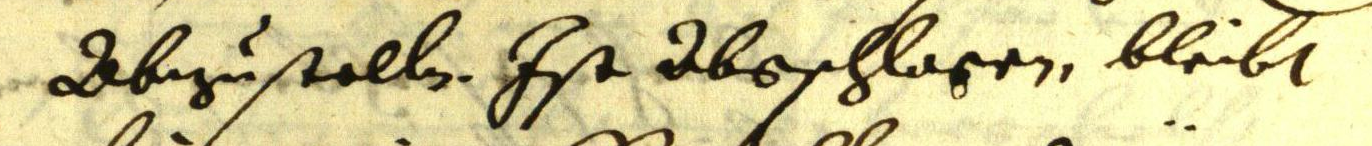Abzūstelln. Ist Abgschlagen, bleibt
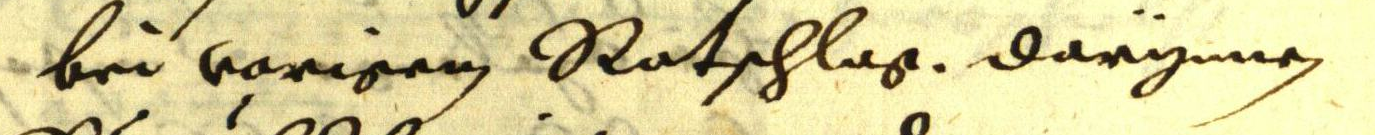bei vorigem Ratschlag. darÿnnen
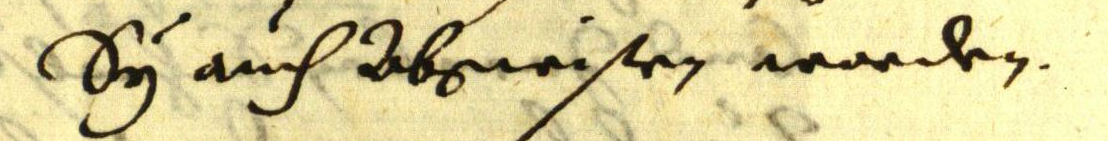Sȳ aūch Abgwisen worden.
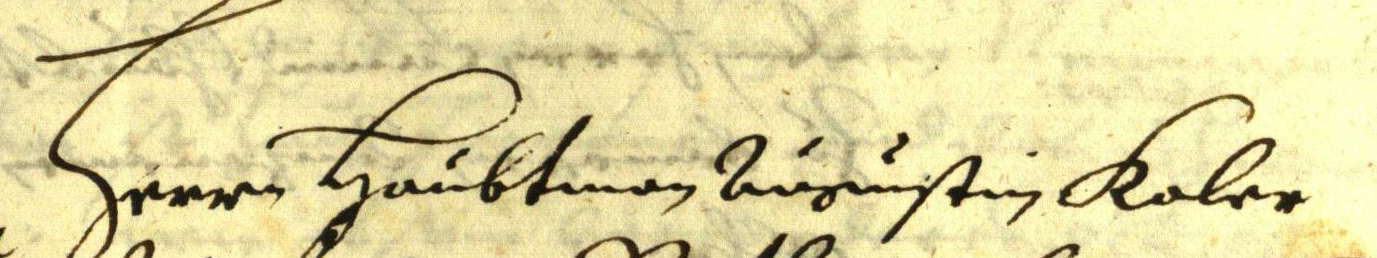Herrn Haūbtman Aūgūstin Koler
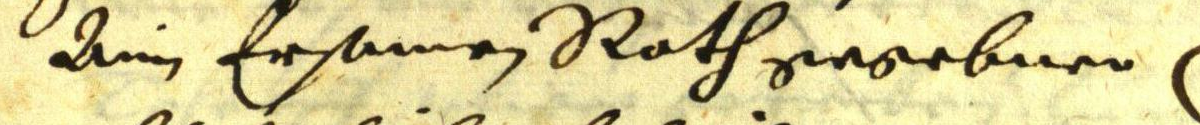Aim Ersamen Rath gegebner
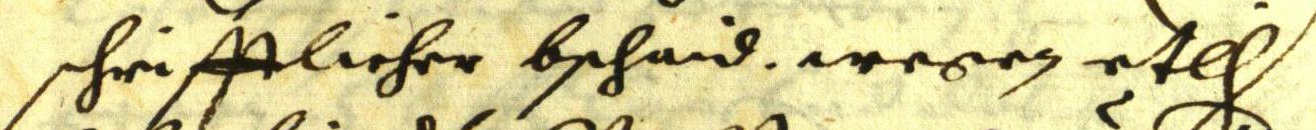schrifftlicher bschaid. wegen etlich
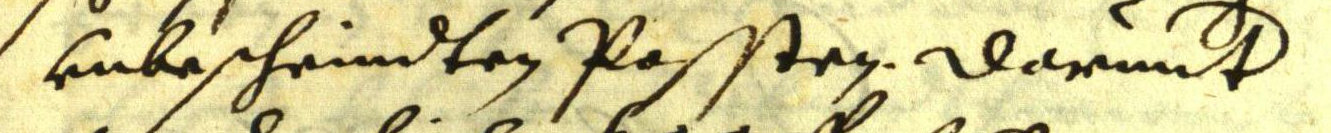vnbescheindten Possten. darūnt
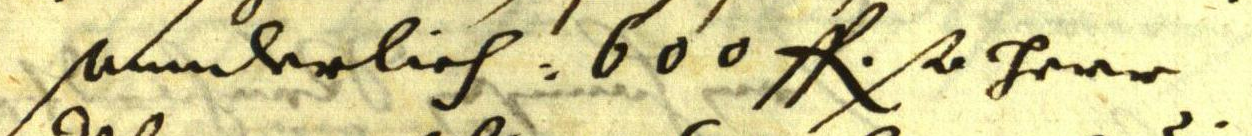sonnderlich: 600 fl. so herr
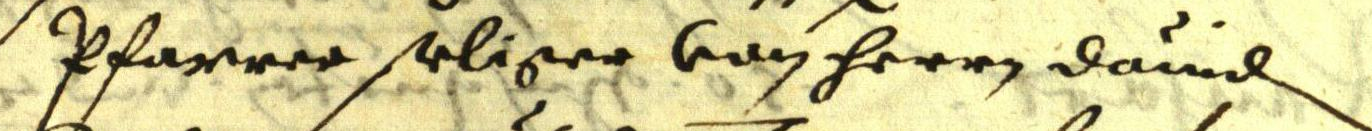Pfarrer seliger von herrn daūid
